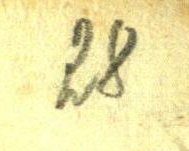28
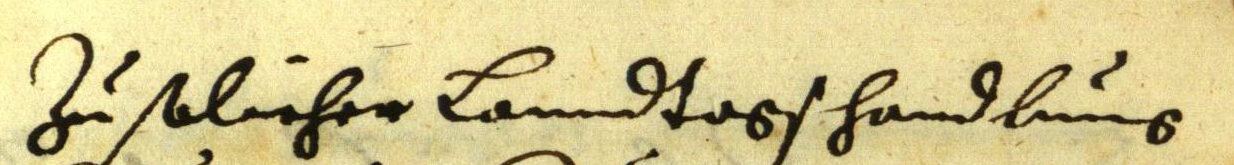Zū solicher Lanndtagshandlūng
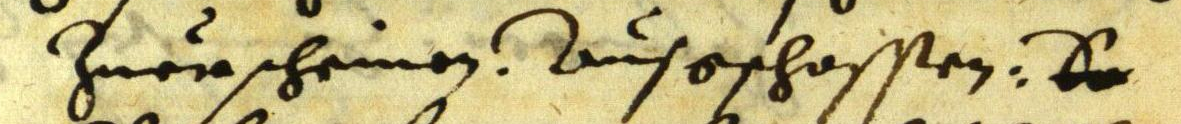Zūerscheinen. Aūsgschlossen So
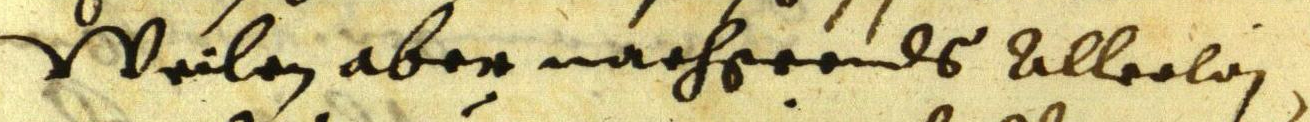Weilen aber nachgeends Allerlai
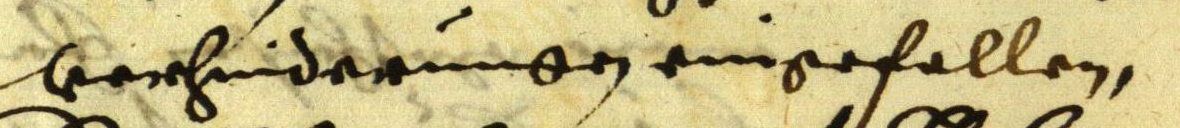verhinderūngen eingefallen,
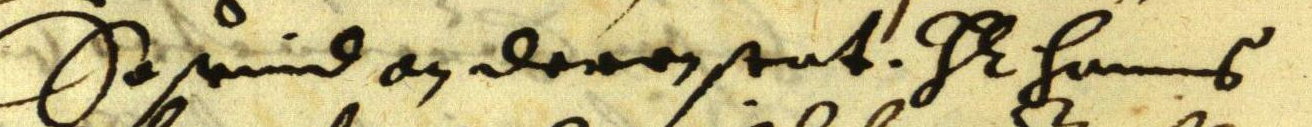So seind an deren stat hl Hanns
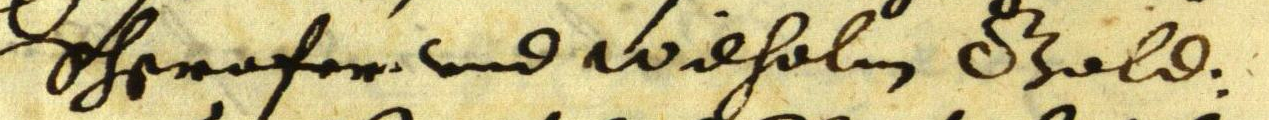Schgrafer. vnd Wilhalm Gold¬
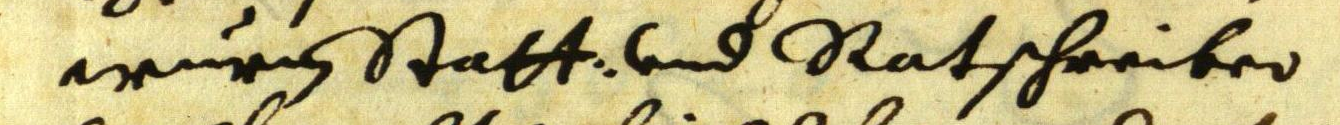wūrm Statt: vnd Ratschreiber
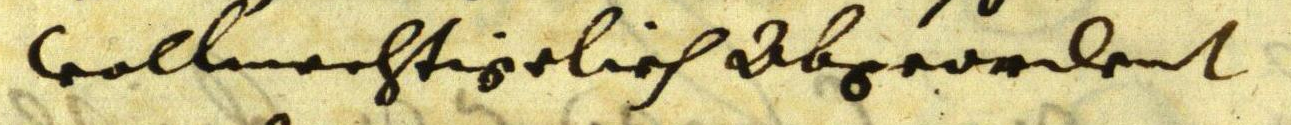vollmechtigelich Abgeordent
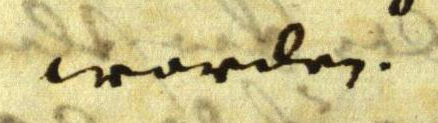worden.
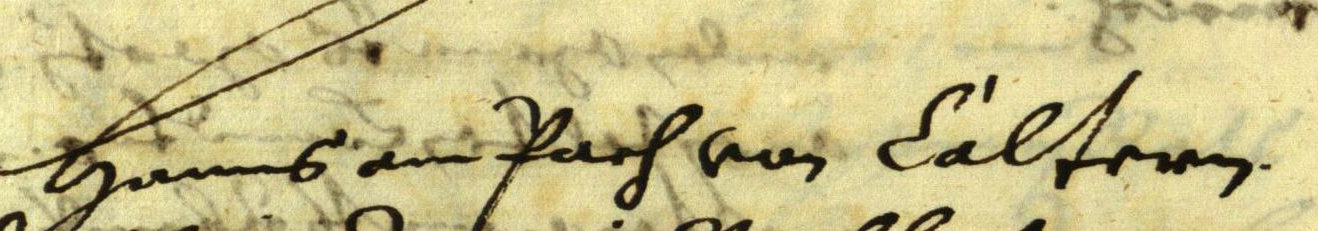Hanns am Pach von Caltern.
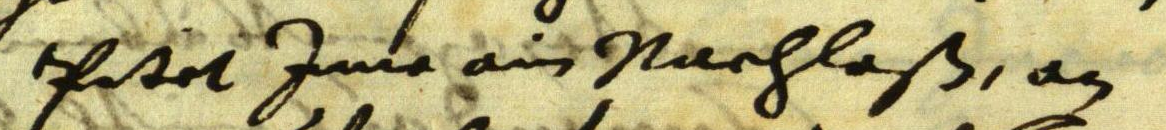Pitet Ime ain Nachlass, an
